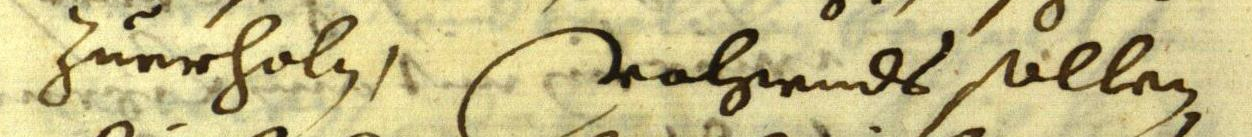Zūerholn, Volgends sollen
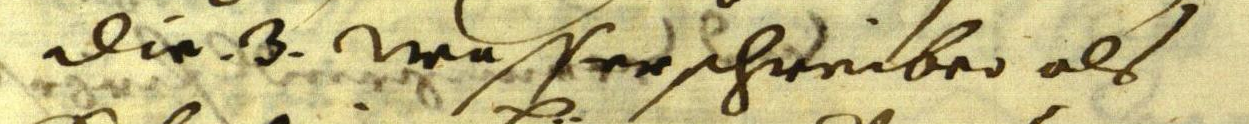die .3. Wasserschreiber als
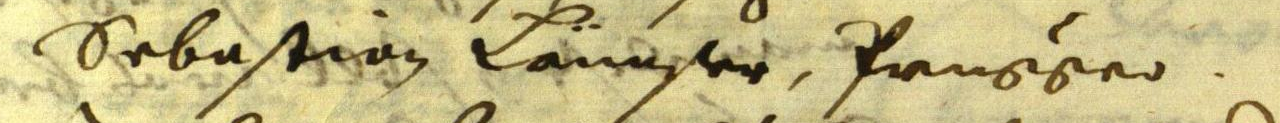Sebastian Lännser, Prūgger
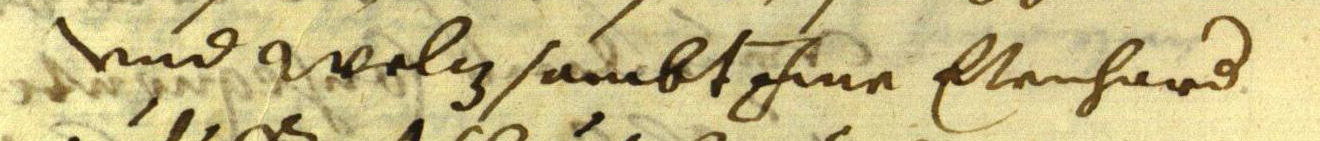vnd Welz sambt Ime Etenhard
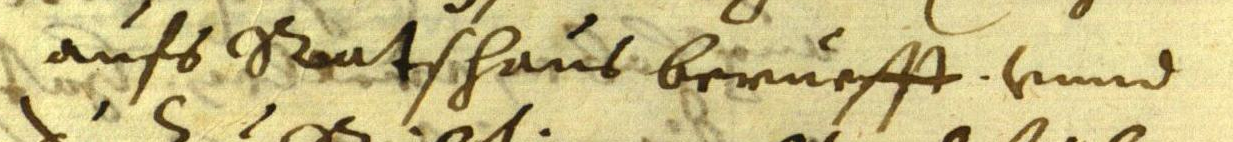aūfs Rathaūs berūefft. vnnd
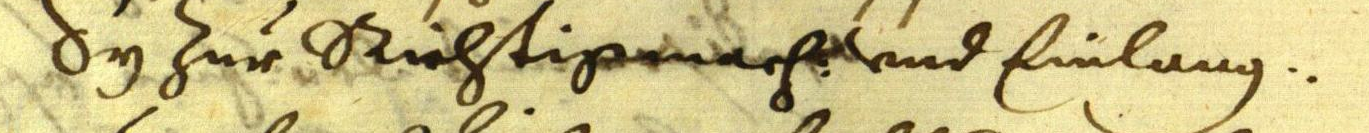Sȳ Zūr Richtigmach: vnd Einlang¬
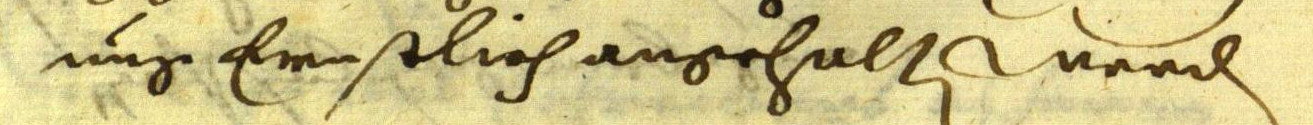ūng Ernstlich angehalt werd
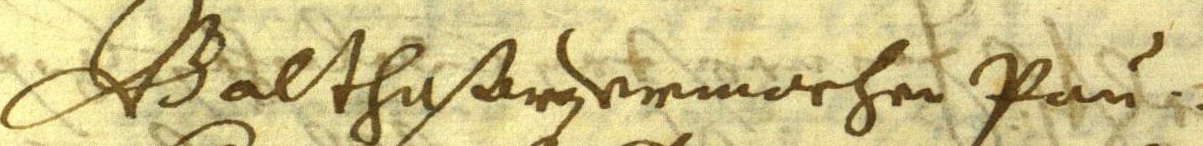Balthasarn Vrmacher Paū¬
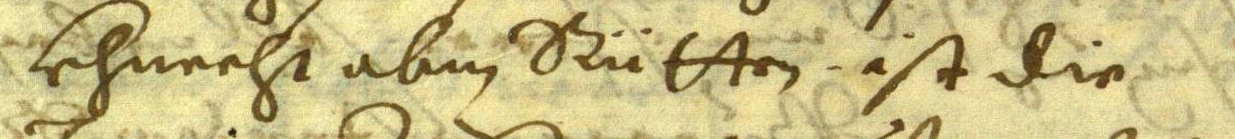khnecht obm Rütten. ist die
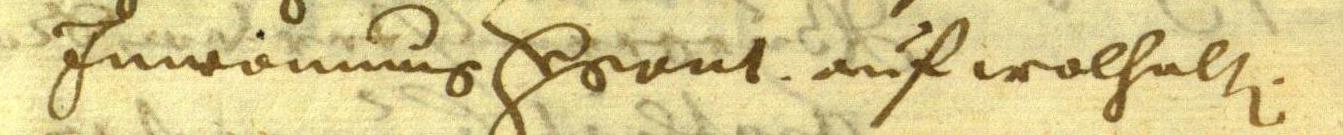Innwonūng vgont. aūf wolhalt.
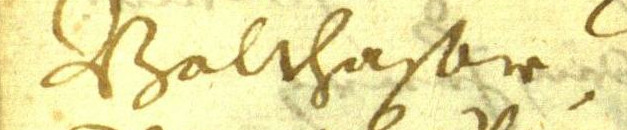Balthasar
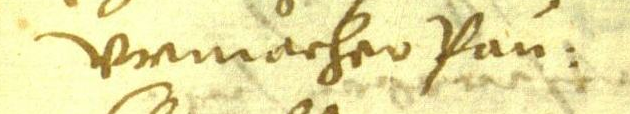Vrmacher Paū¬
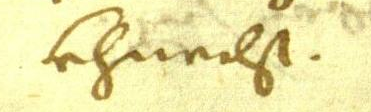khnecht.
